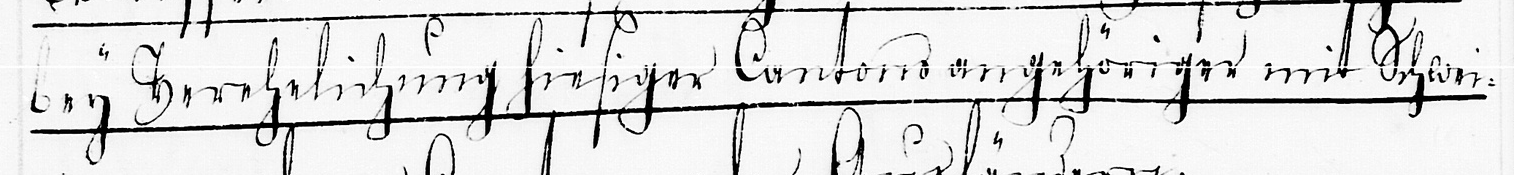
bey Verehelichung hiesiger Cantonsangehöriger mit Schwei¬
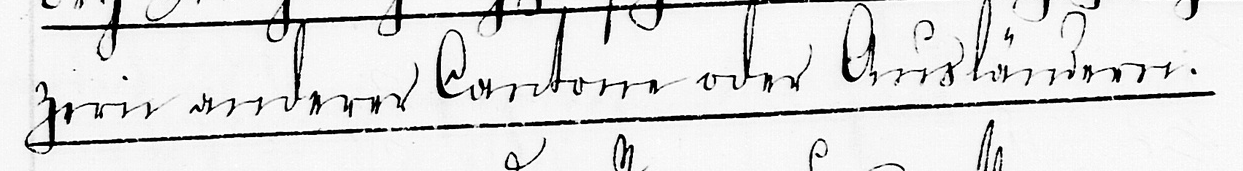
zern anderer Cantone oder Ausländern.
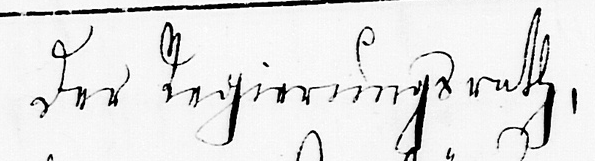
Der Regierungsrath,
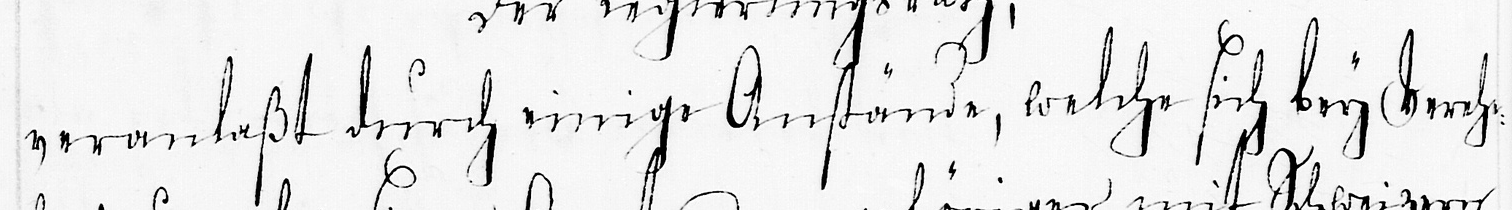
veranlaßt durch einige Anstände, welche sich bey Vereh¬
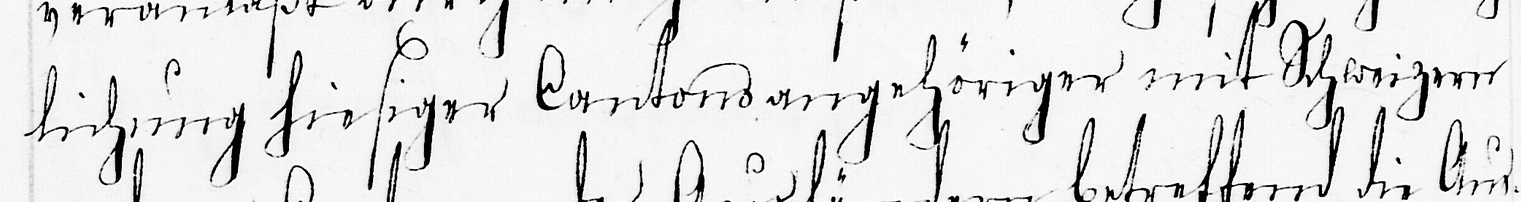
elichung hiesiger Cantonsangehöriger mit Schweizern
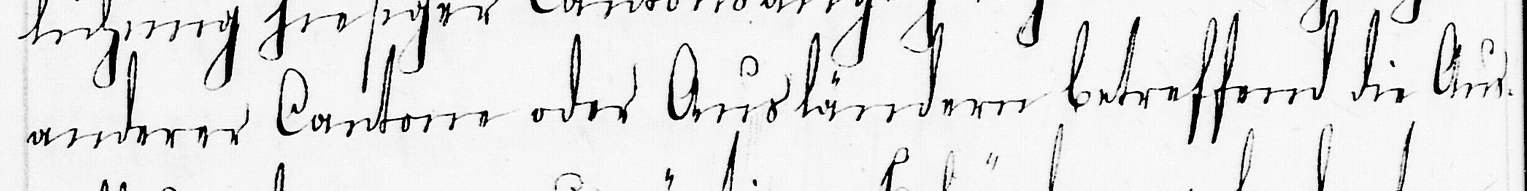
anderer Cantone oder Ausländern betreffend die Aus¬
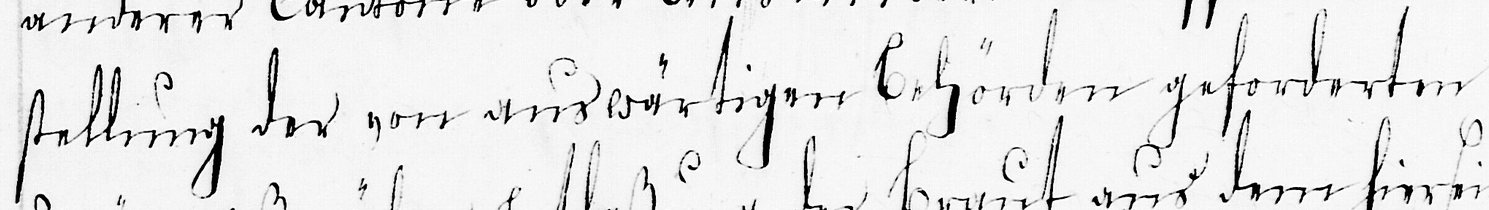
stellung der von auswärtigen Behörden geforderten
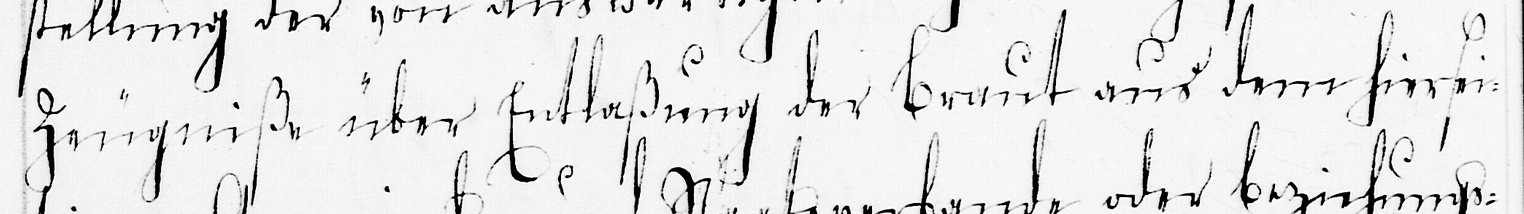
Zeugniße über Entlaßung der Braut aus dem hiersei¬
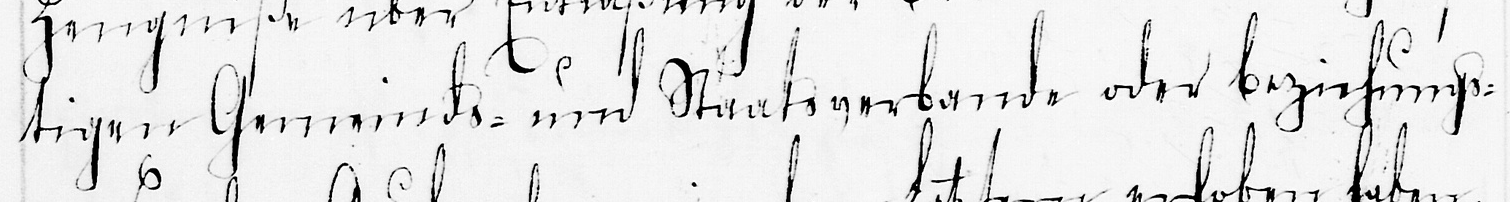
tigen Gemeinds- und Staatsverbande oder beziehungs¬
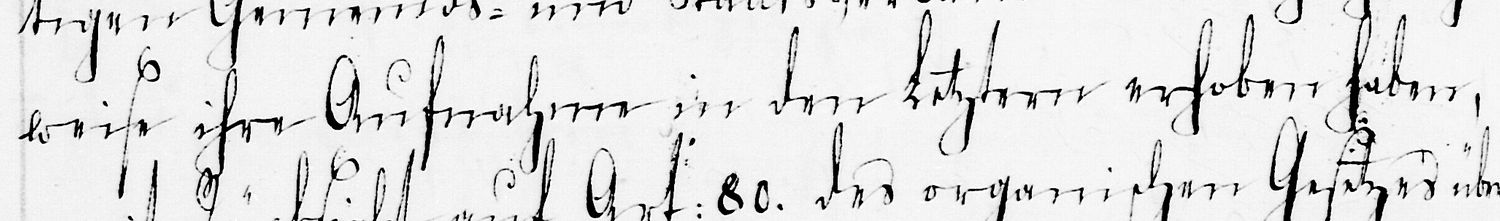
weise ihre Aufnahme in den Letztern erhoben haben,
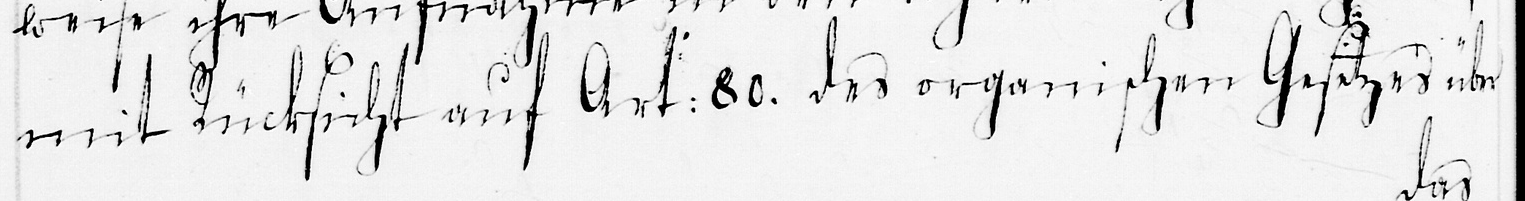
mit Rücksicht auf Art: 80. des organischen Gesetzes über
